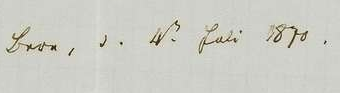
Bern, d. 4t Juli 1870.
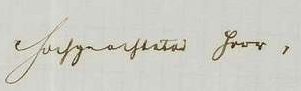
Hochgeachteter Herr.
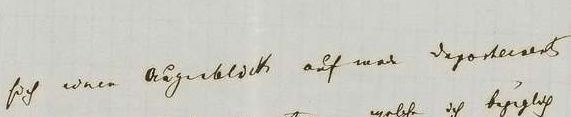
sich einen Augenblick auf mein Departement
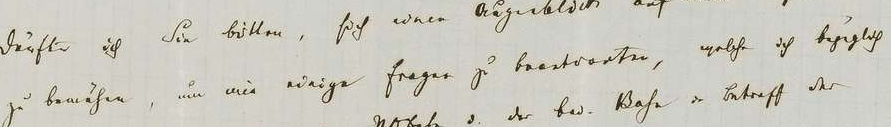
zu bemühen, um mir einige Fragen zu beantworten, welche ich bezüglich
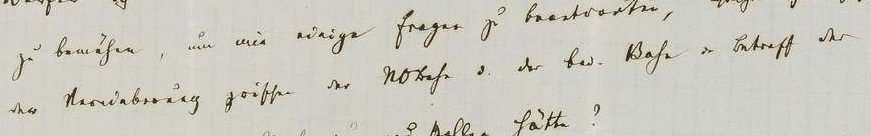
der Vereinbarung zwischen der NOBahn u. d. bad. Bahn in Betreff der
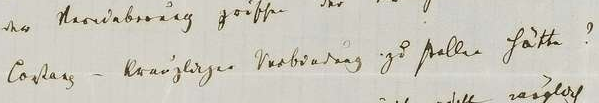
Costanz–Kreuzlinger Verbindung zu stellen hätte?
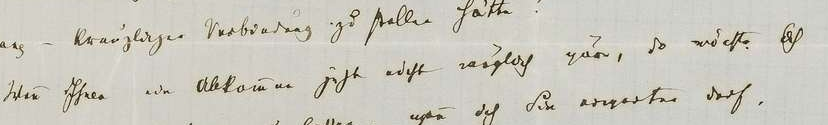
Wenn Ihnen ein Abkommen jezt nicht möglich wäre, so möchte ich
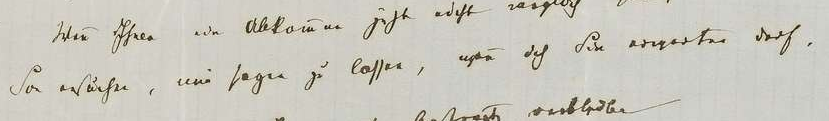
Sie ersuchen, mir sagen zu lassen, wann ich Sie erwarten darf.
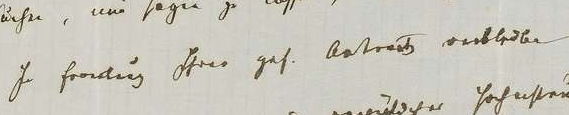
In Erwartung Ihrer gef. Antwort verbleibe
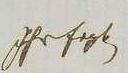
Ihr Ergber
